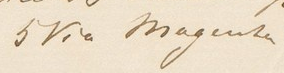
5 Via Magenta
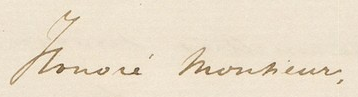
Honoré Monsieur,
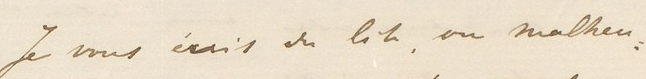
Je vous écris du lit, ou malheu-
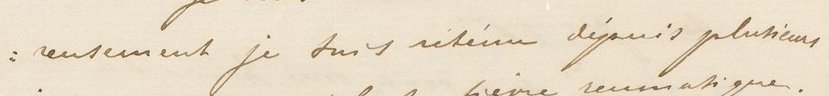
reusement je suis réténu dépuis plusieurs
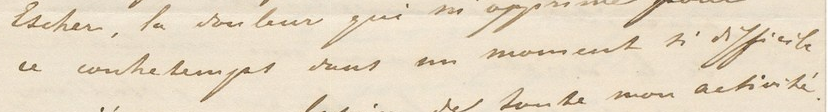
ce contretemps dans un moment si difficile
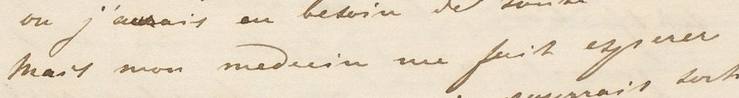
Mais mon medecin me fait esperer
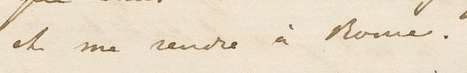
et me rendre à Rome.
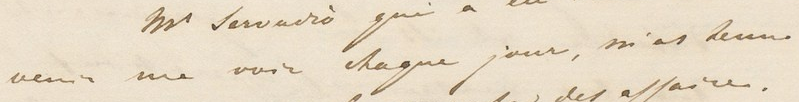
venir me voir chaque jour, m'as tenu
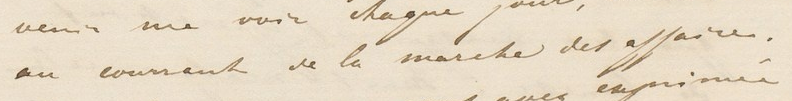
au courrant de la marche des affaires.
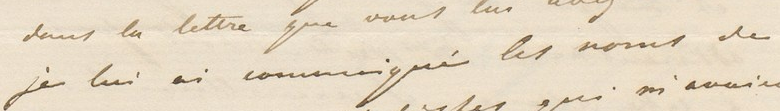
je lui ai communiqué les noms de
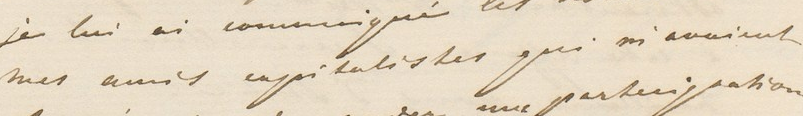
mes amis capitalistes qui m'avaient
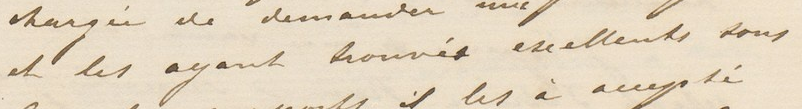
et les ayant trouvés excellents sous
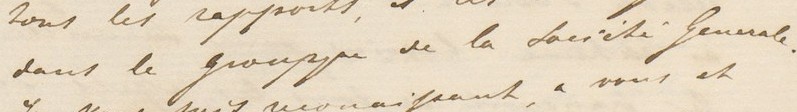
dans le grouppe de la Société Generale.
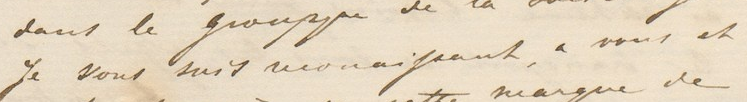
Je vous suis reconaissant, a vous et
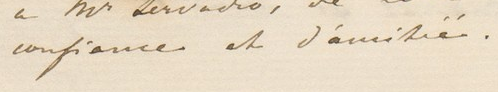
confiance et d'amitié.
